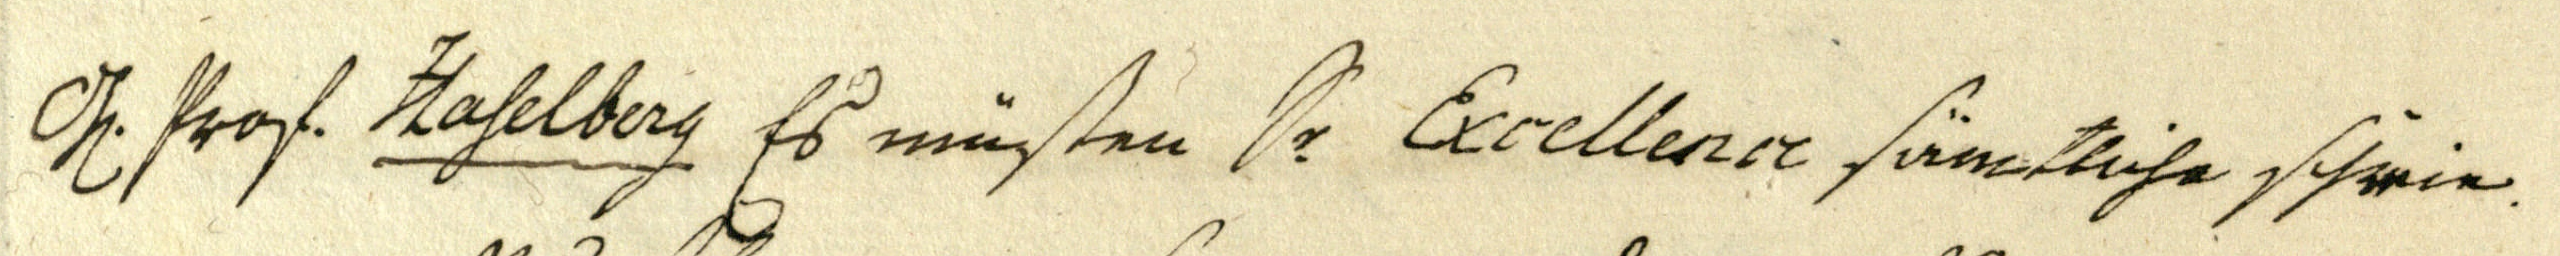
dh. Prof. Haselberg. Es müsten Sr. Excellence sämtliche schwie¬
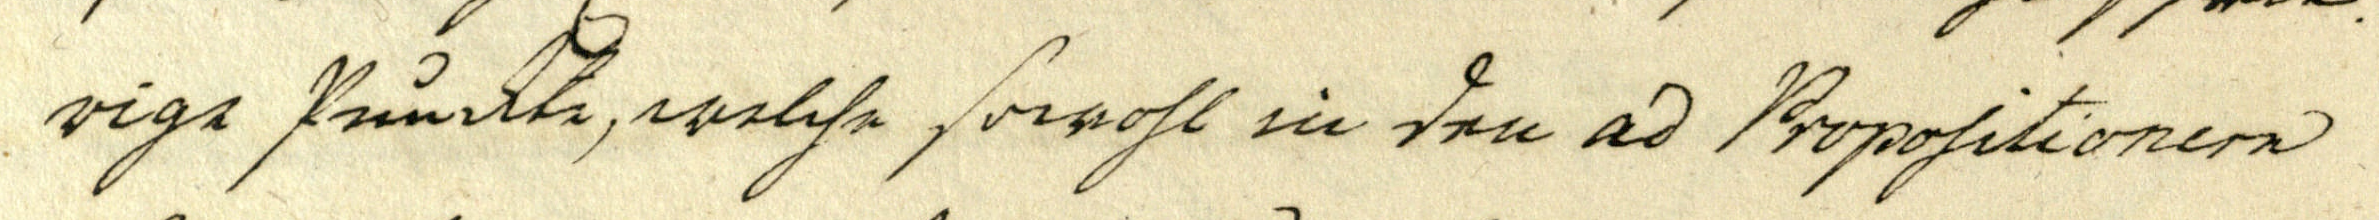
rige Punckte, welche sowohl in den ad Propositionem
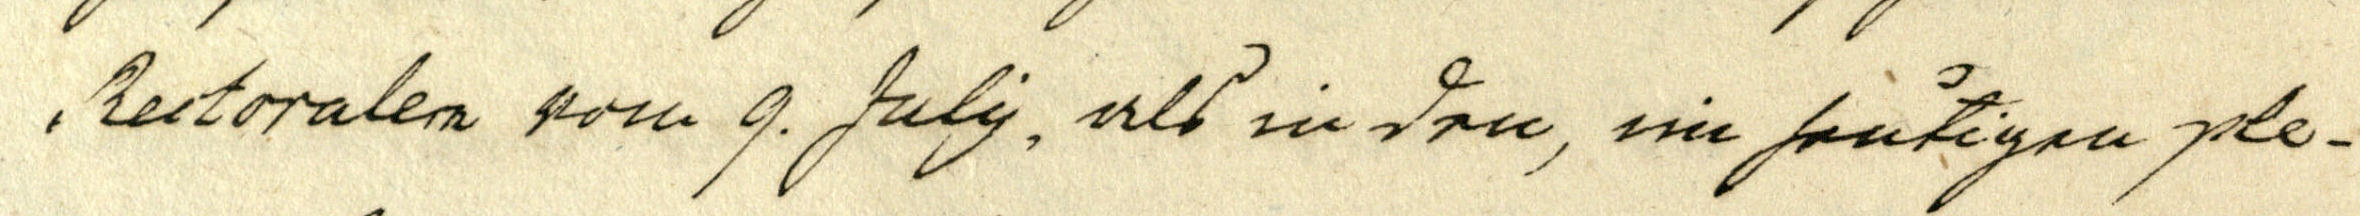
Rectoratem vom 9. Julÿ, als in den im heutigen ple¬
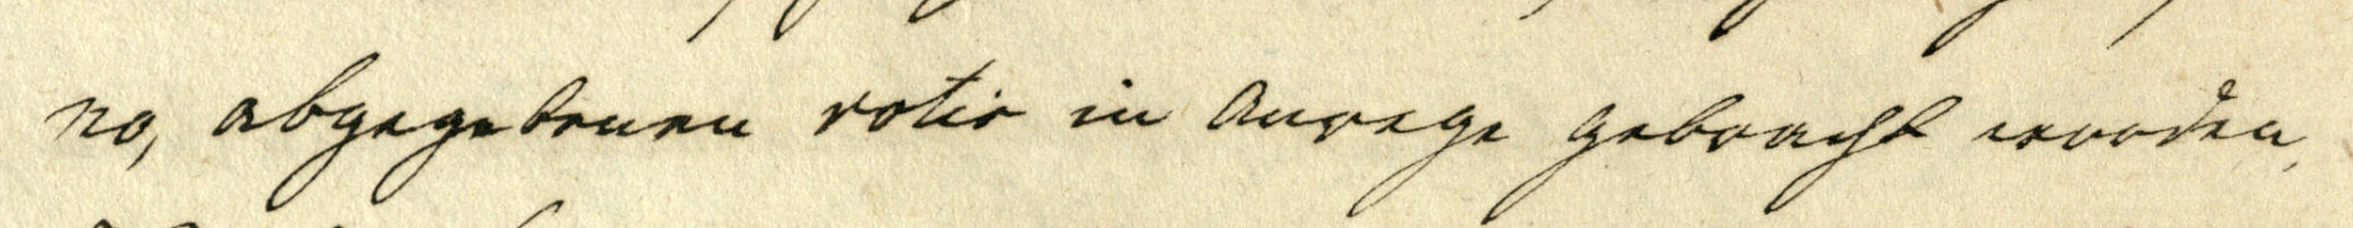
no, abgegebenen votis in Anrege gebracht werden,
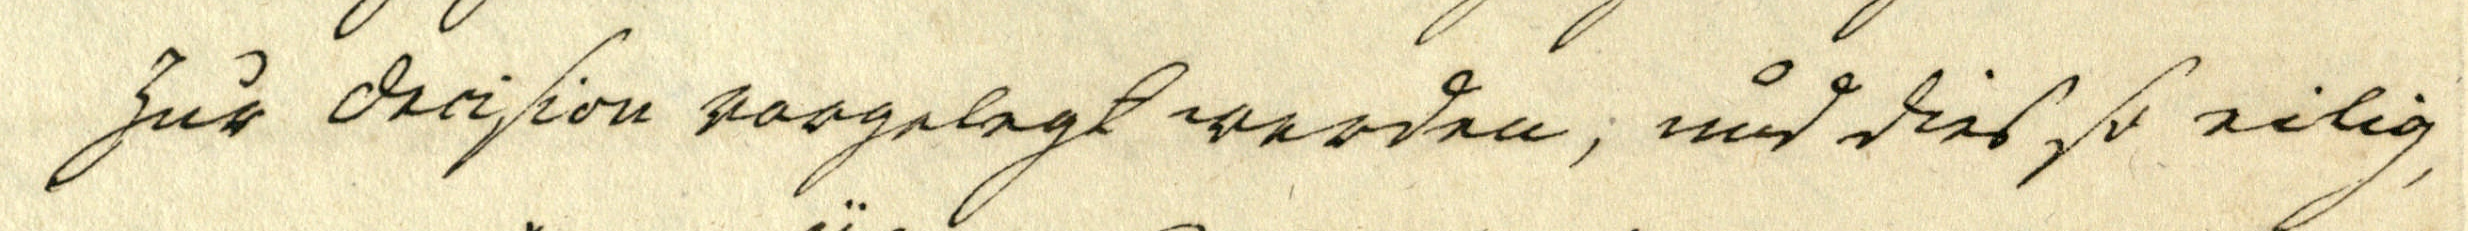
Zur Decision vorgelegt werden, und dies so eilig
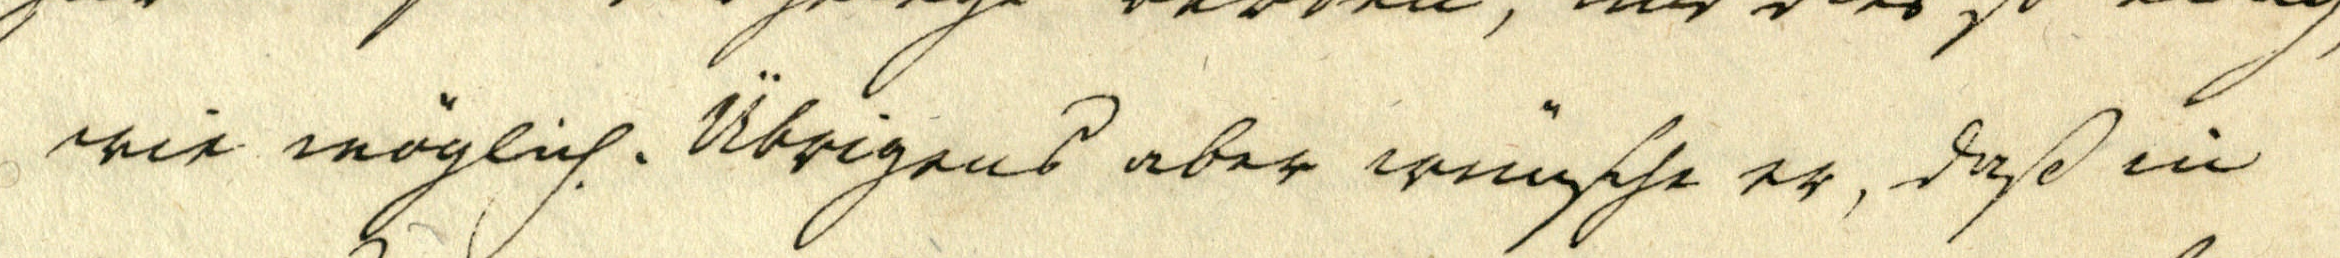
wie möglich. Übrigens aber wünsche er, daß in
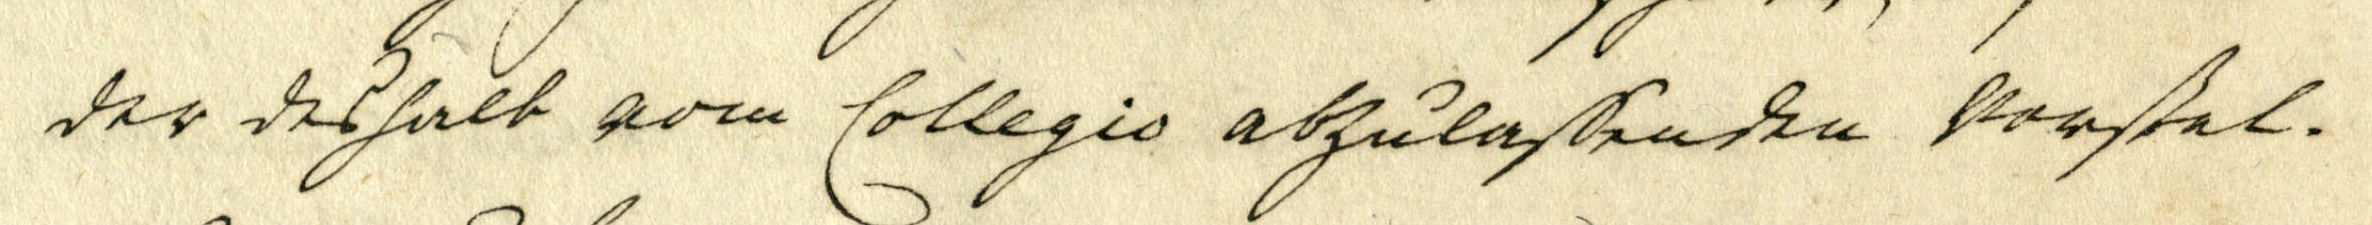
der deshalb vom Collegio abzulassenden Vorstel¬
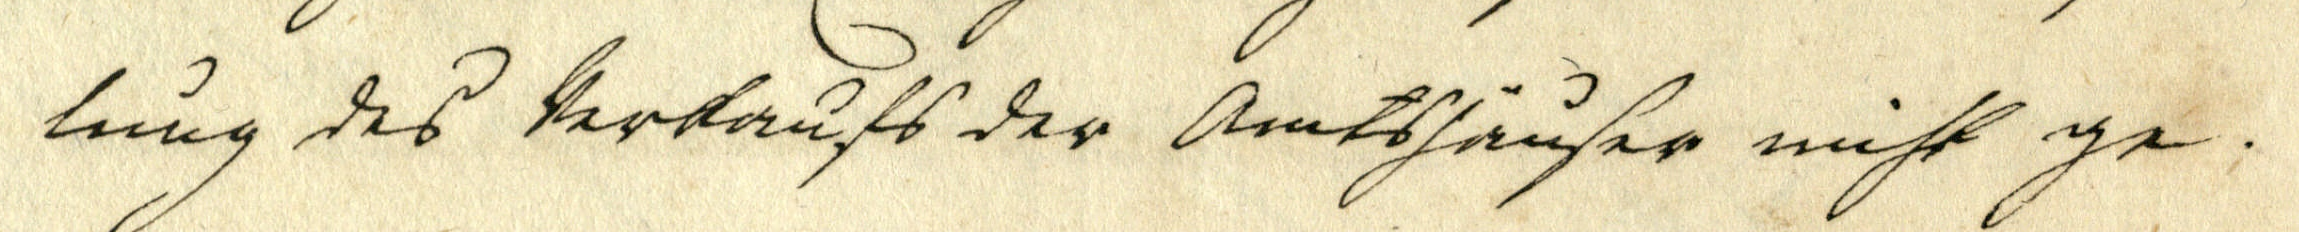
lung des Verkaufs der Amtshäuser nicht ge¬
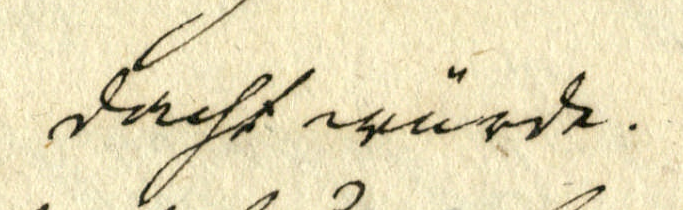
dacht würde.
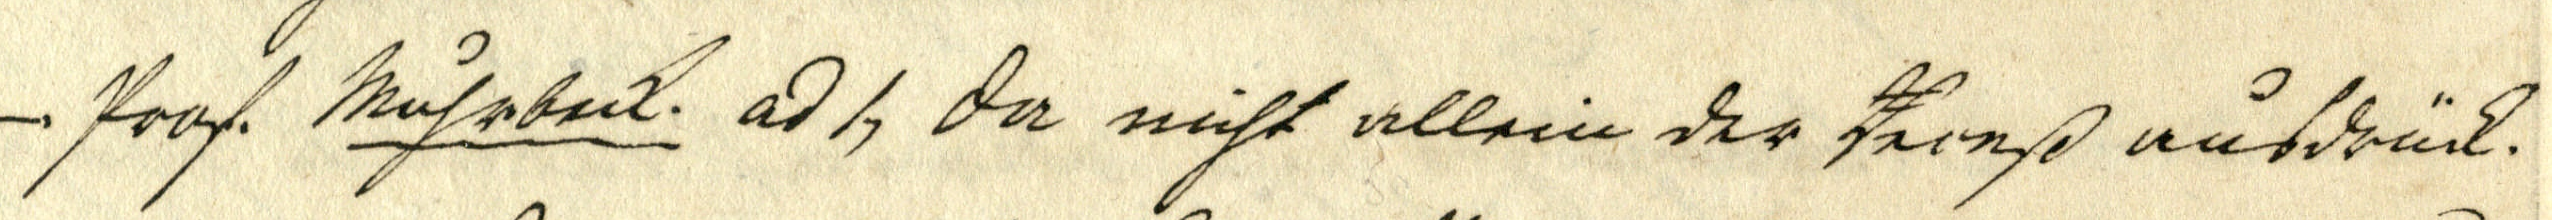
Prof. Muhrbeck. ad 1, da nicht allein der Receß ausdrück¬
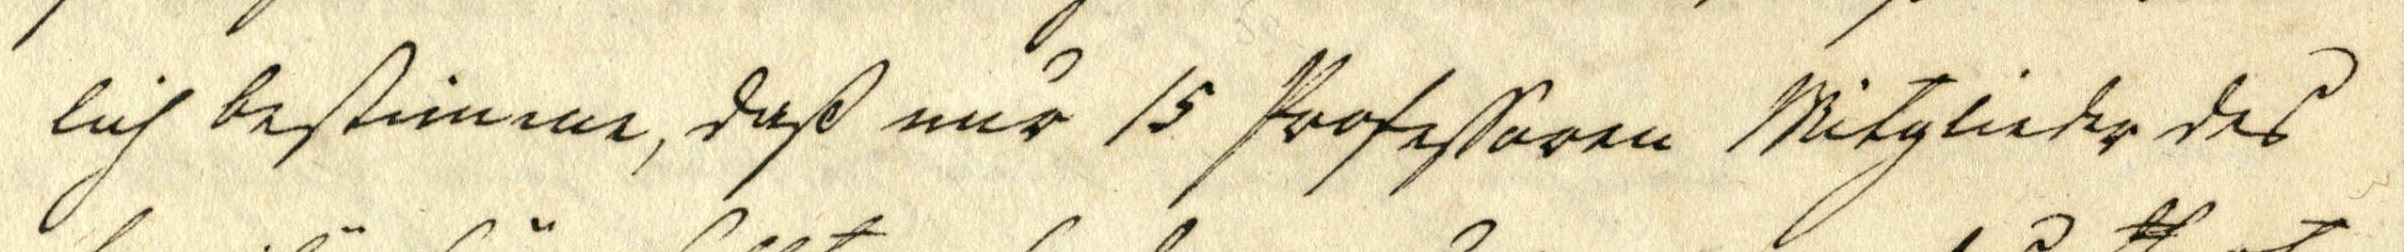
lich bestimme, daß nur 15 Professoren Mitglieder des
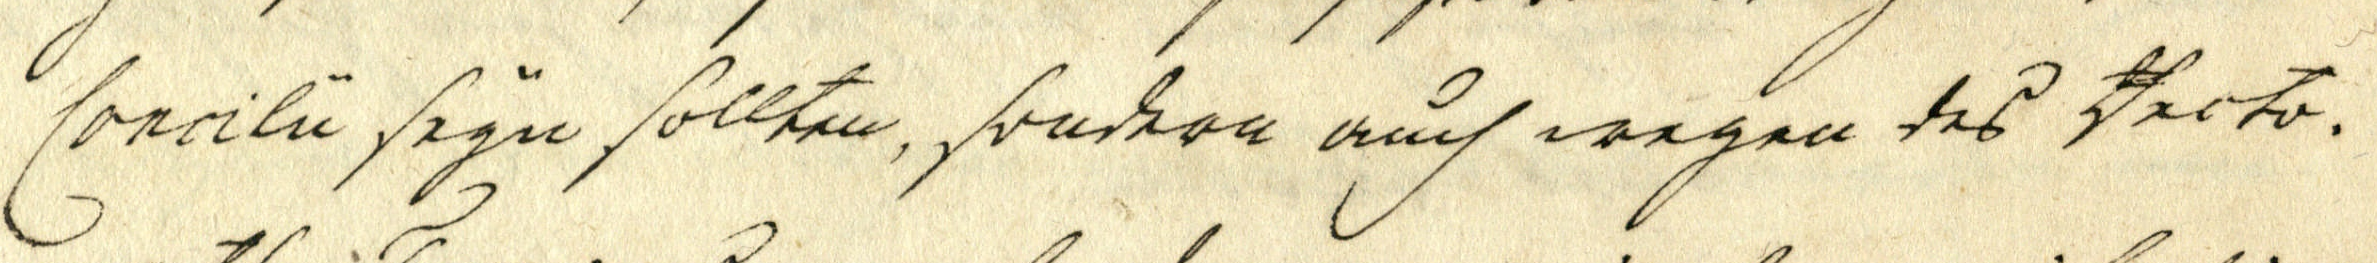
Concilii seÿn sollten, sondern auch wegen des Recto¬
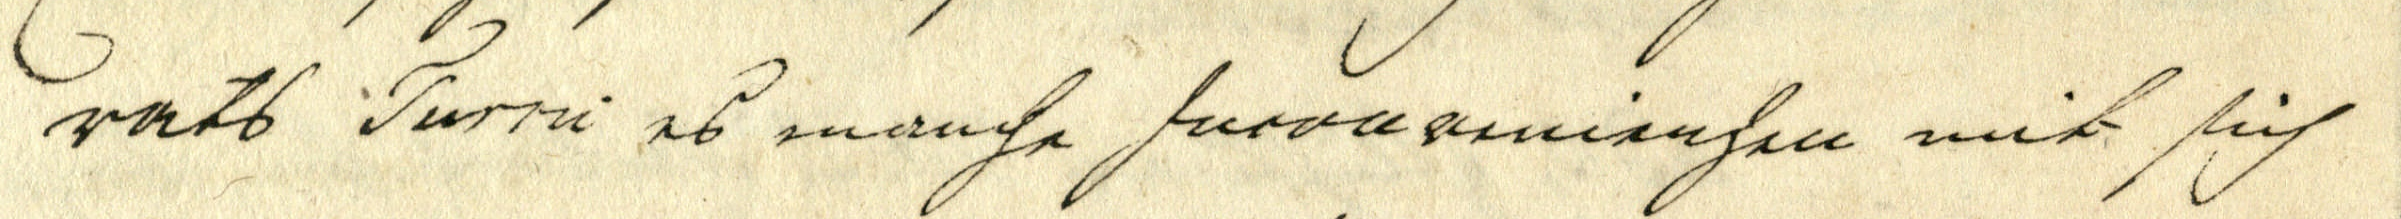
rats Turni es manche Inconvenienzen mit sich
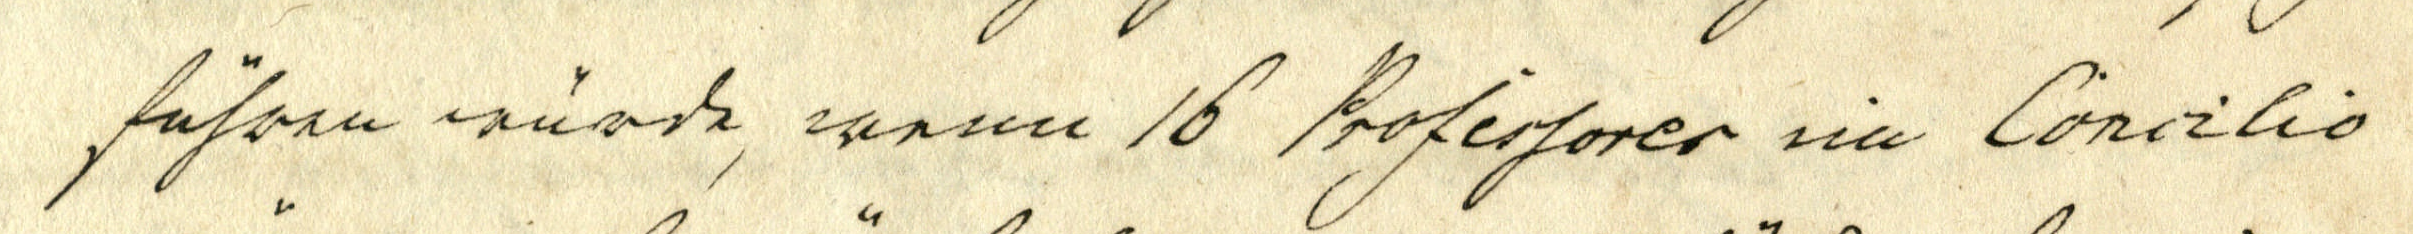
führen würde, wenn 16 Professores im Concilio
